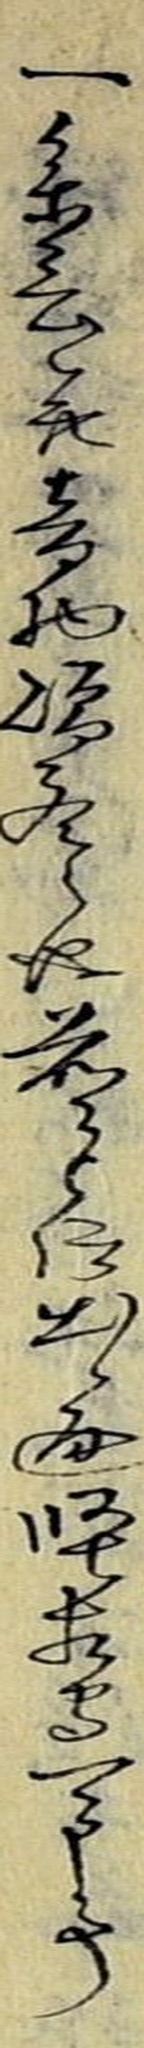一参会并音物贈答之儀前々被仰出候通堅相守可申事
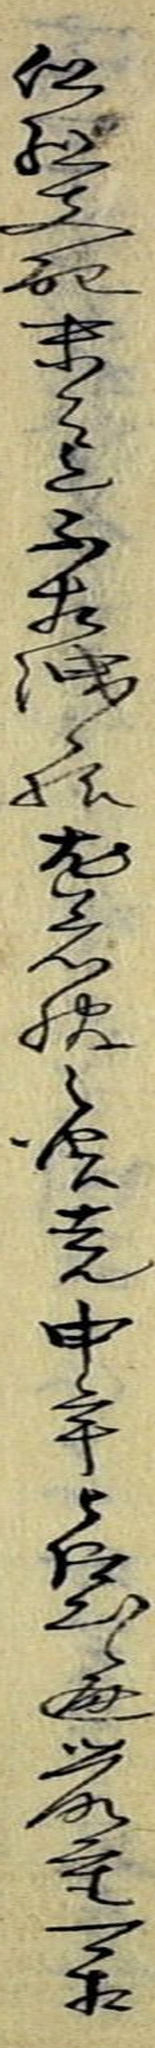但組支配末々迄不相洩候様尤着服之儀は去ル申年被仰出候通厳重可相
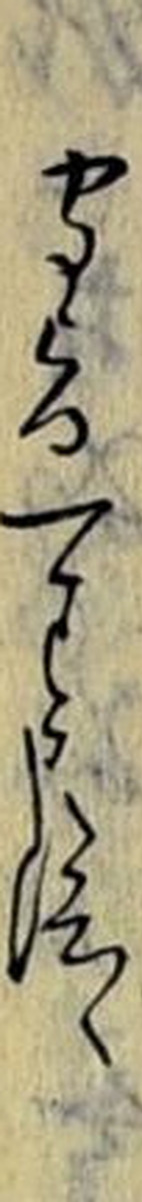守旨可被申渡候
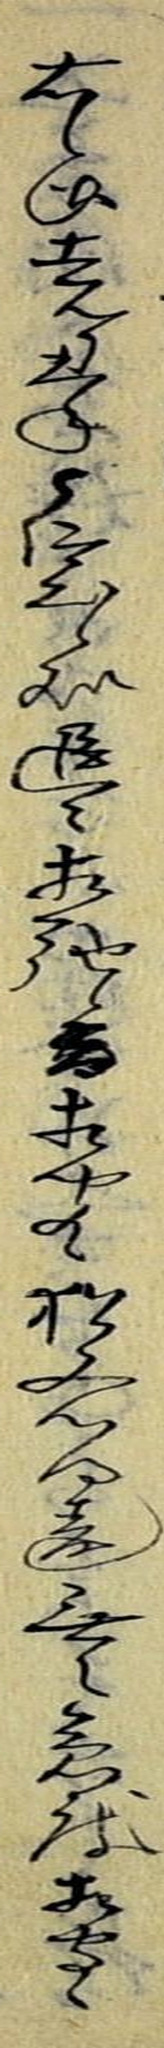右之趣去ル丑年被仰出候処追々相弛候旨相聞候猶又心得違無之急度相守候
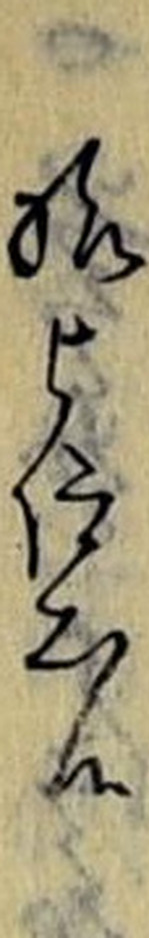様被仰出候
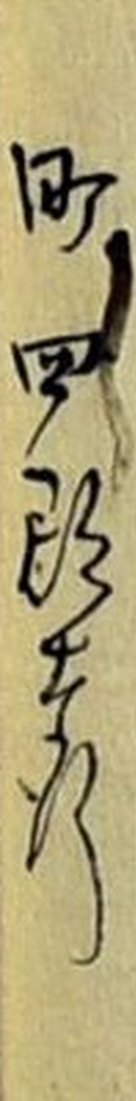町四郡奉行
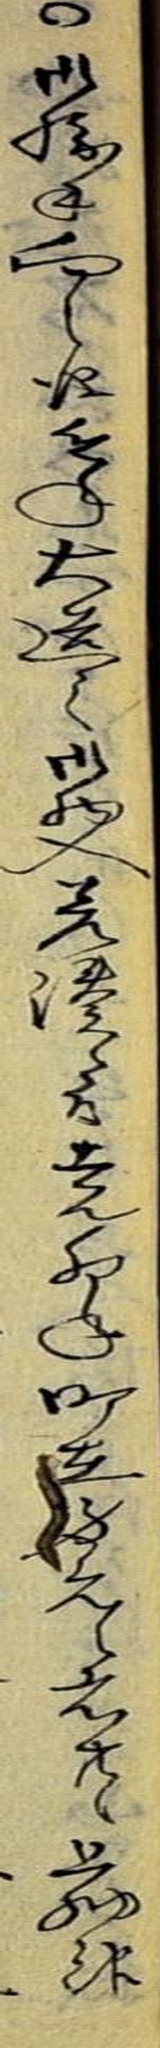○御勝手向之儀近年大造之御物入差湊に付去ル卯年町在身元之物共へ上納銀
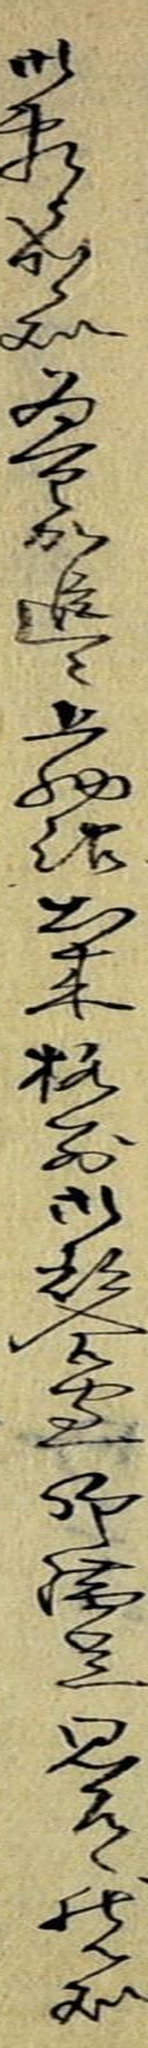御頼被成候処為冥加追々上納銀出来格別御都合宜御満足思召候然ル処
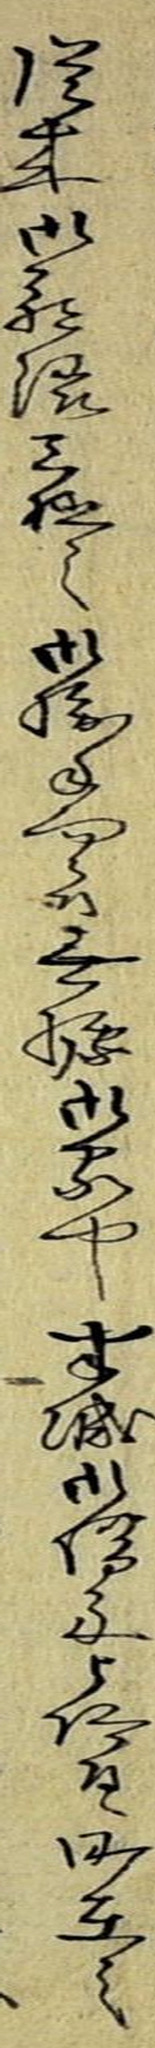従來御難渋至極之御勝手向に付無拠御家中半減御借米被仰付候町在之
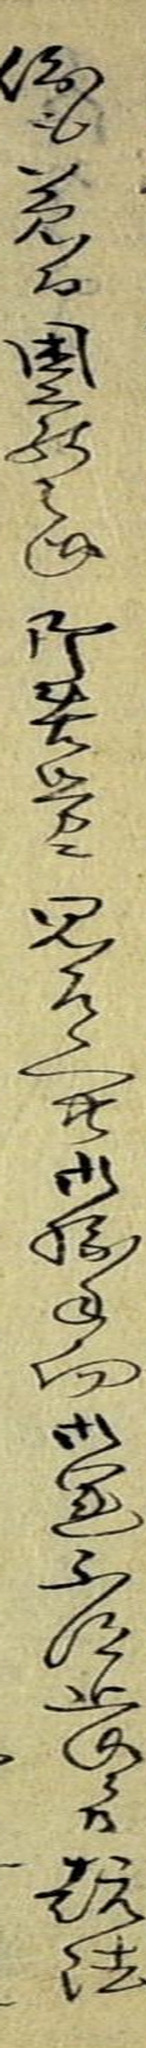儀も兼而困窮之趣御苦労に思召候へ共御勝手向御運不得止趣に付趣法
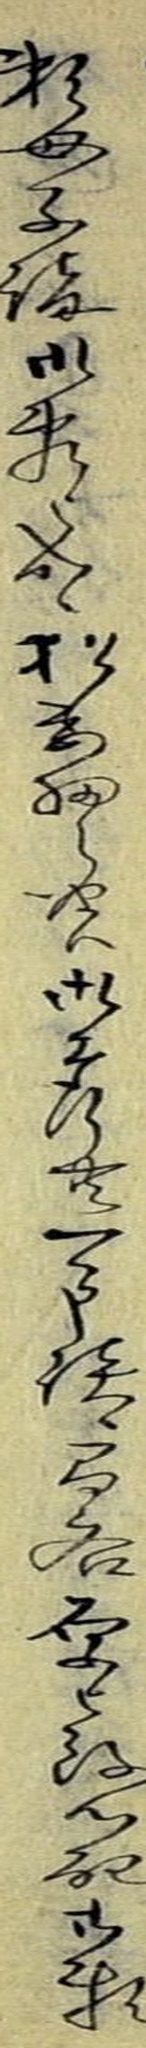頼母子講御頼被成候猶委細之儀は御奉行共可申談候間各厚被致心配御頼
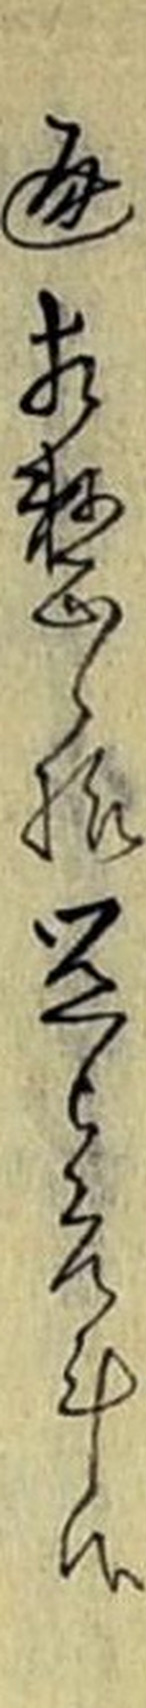通相整候様宜被取斗候
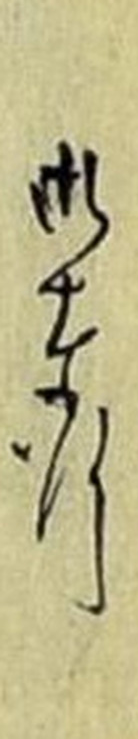御奉行
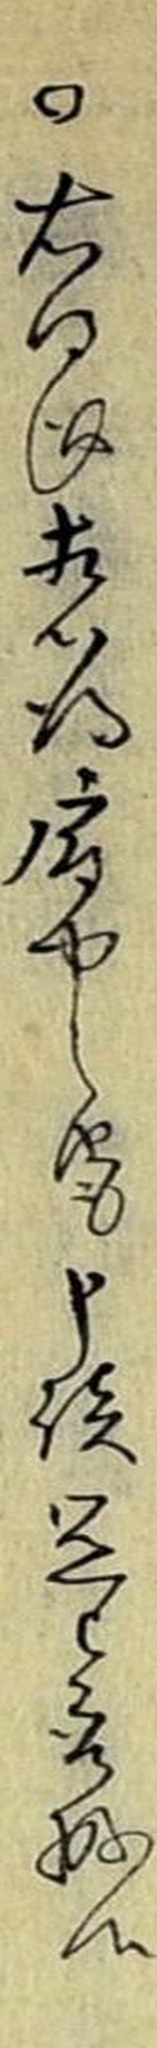○右同趣相心得府中之儀も申談宜被取扱候
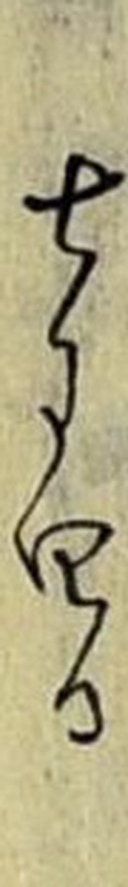七月四日
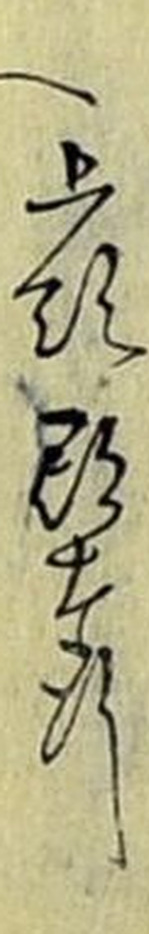上領郡奉行
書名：命令之部 四
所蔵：福井県文書館 Fukui Prefectural Archives
